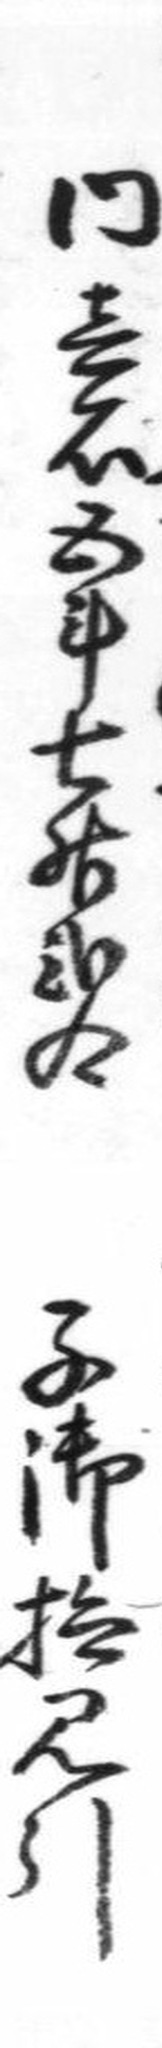内壱石五斗七升弐合子御検見引
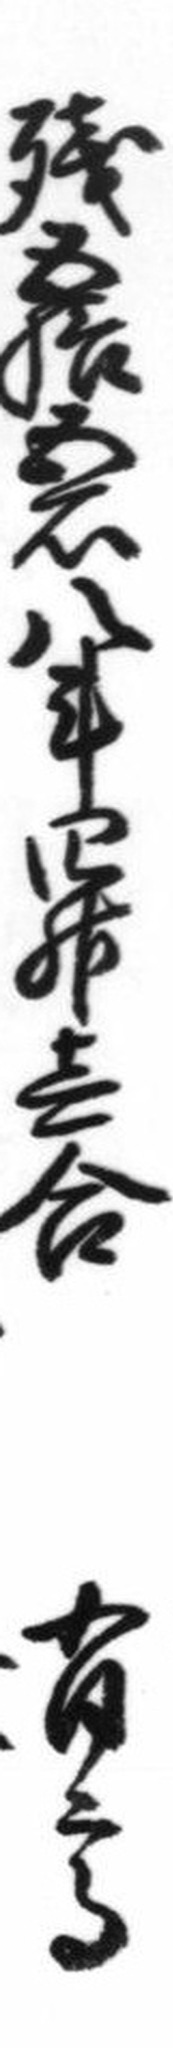残五拾五石八斗四升壱合有高
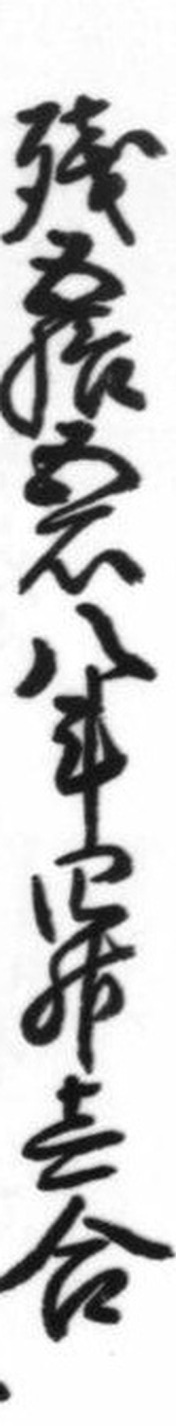残五拾五石八斗四升壱合有高
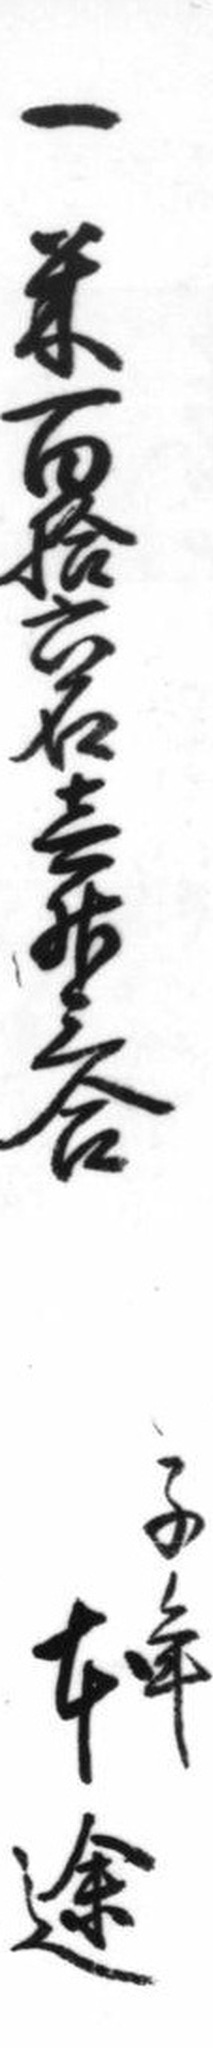一米百拾六石壱升三合本途
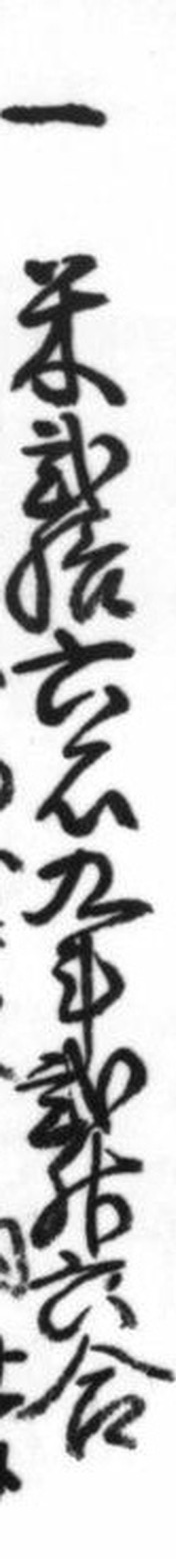一米弐拾六石九斗弐升六合夫米
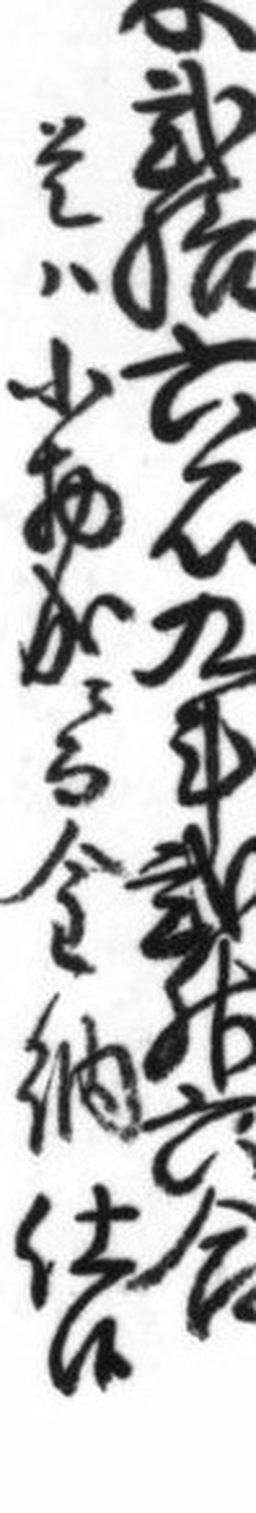是ハ小物成ニ而金納仕候
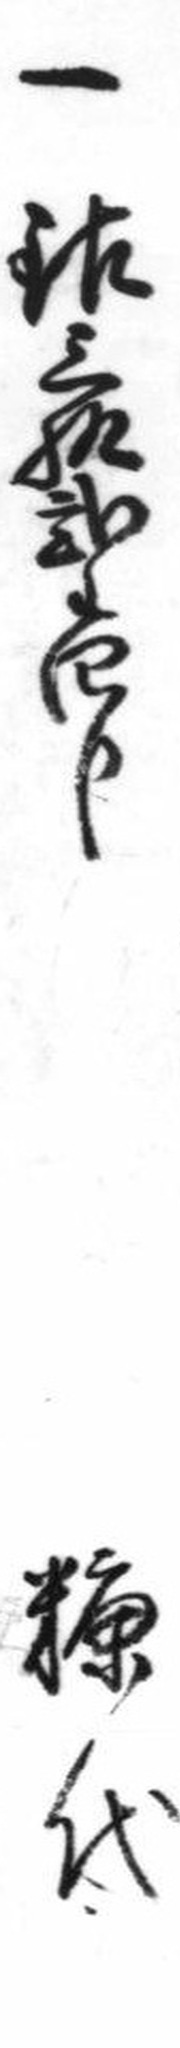一銀三拾弐匁四分糠代
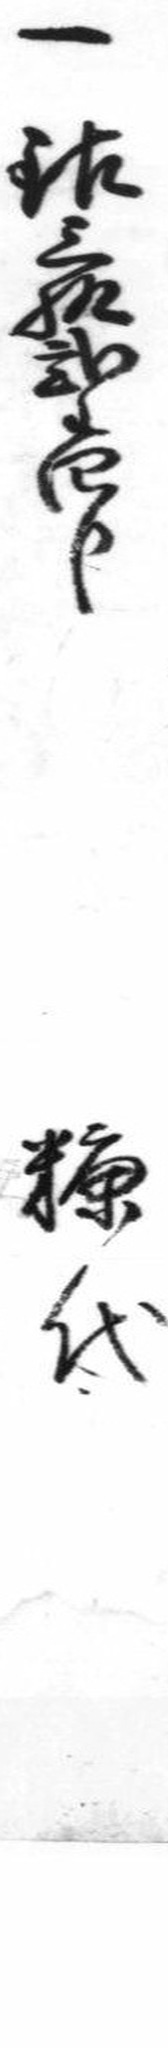一銀三拾弐匁四分糠代
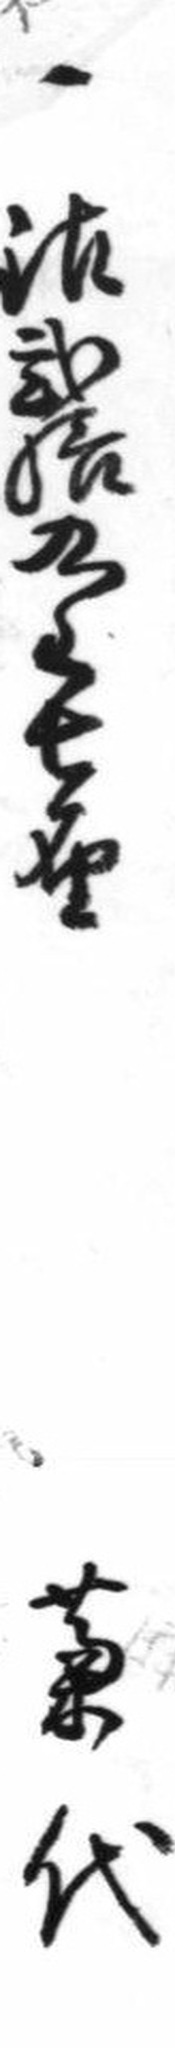一銀弐拾九匁七厘藁代
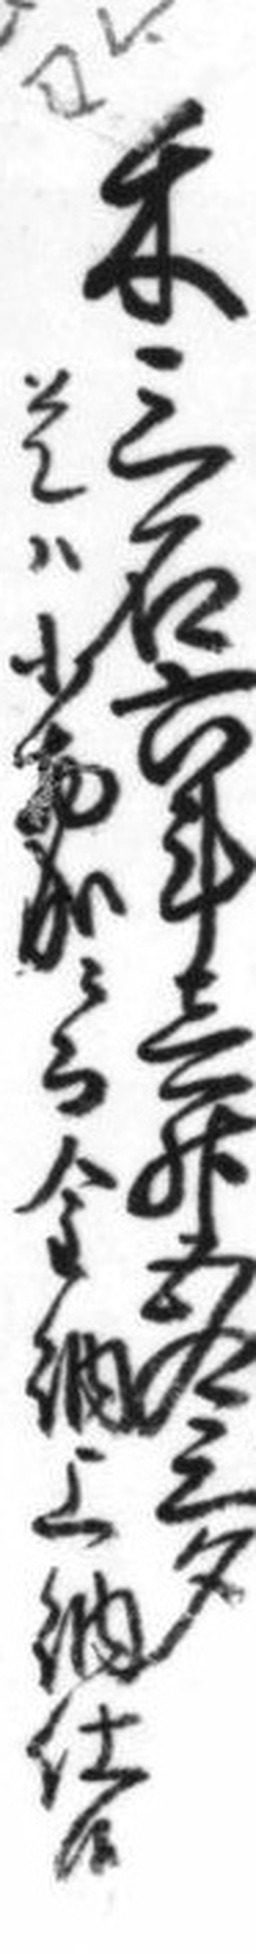是ハ小物成ニ而金納仕候
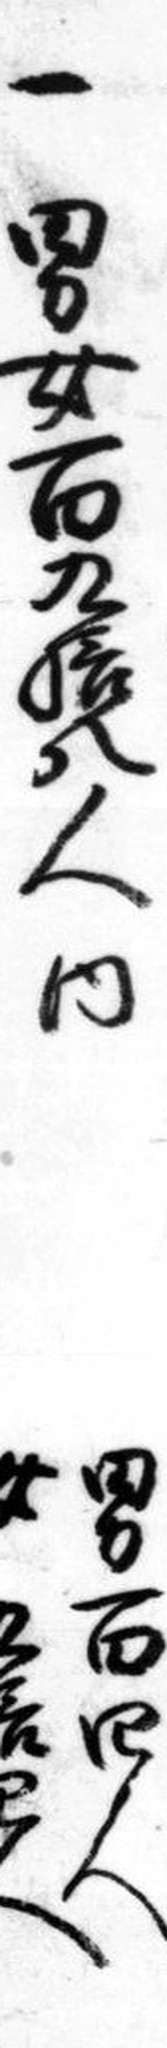一男女百九拾八人内男百四人
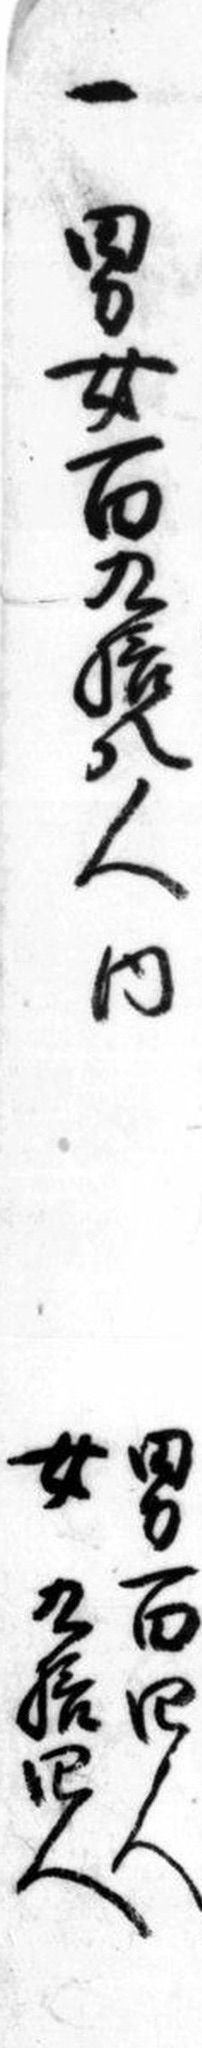一男女百九拾八人内男百四人
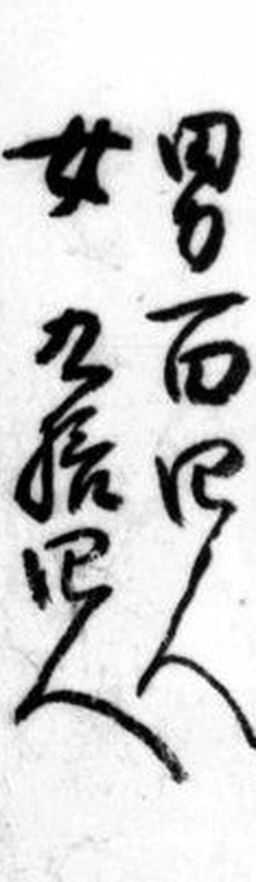女九拾四人

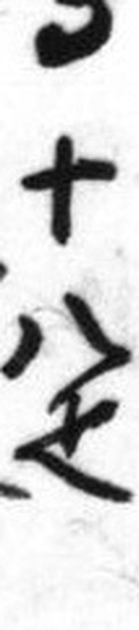牛八疋
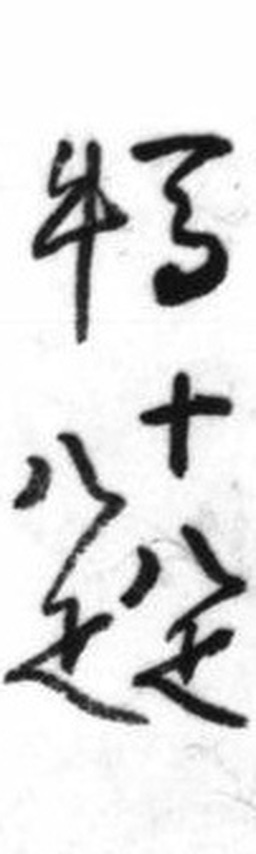牛八疋
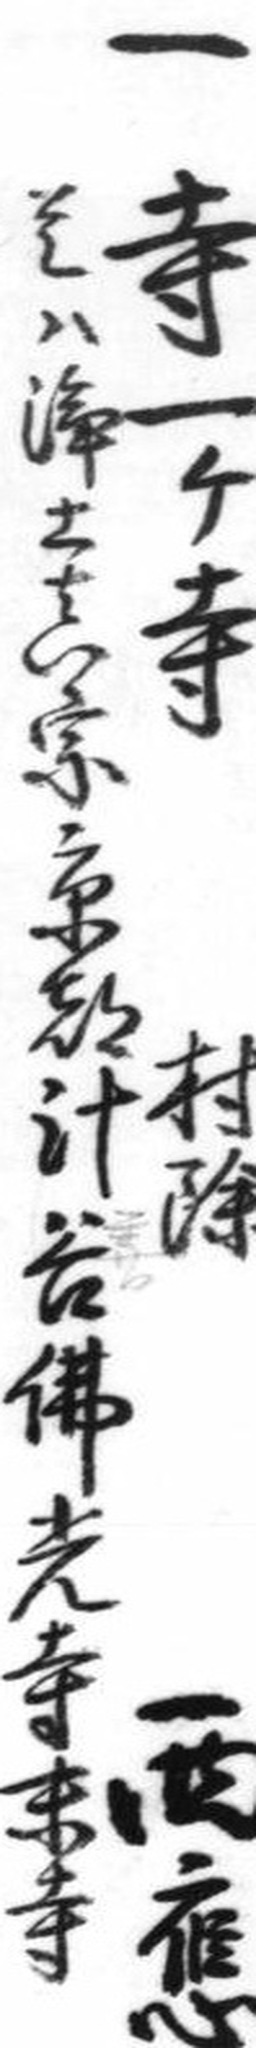是ハ浄土真宗京都汁谷仏光寺末寺
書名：越前国大野郡今井村明細帳
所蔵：福井県文書館 Fukui Prefectural Archives
